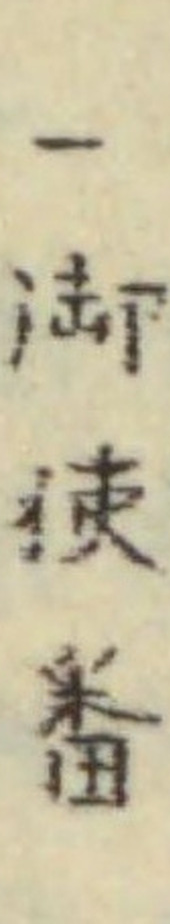一御使番同
